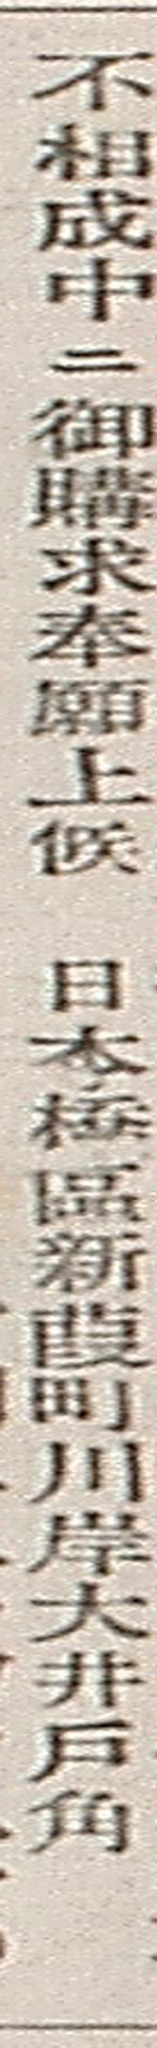不相成中二御購求奉願上候日本橋區葭町河岸大井戸角
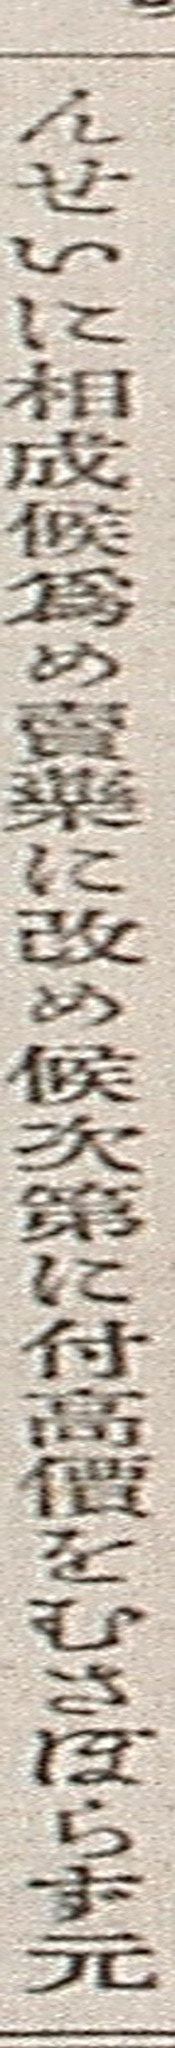んせいに相成候為め売薬に改め候次第に付高価をむさぼらず元
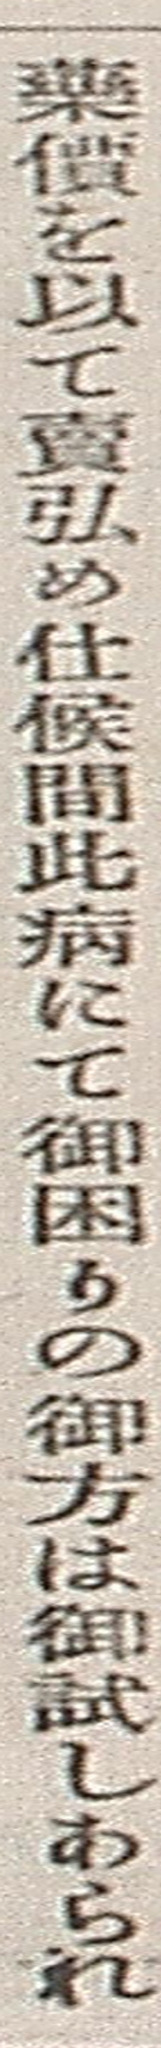薬価を以て売弘め仕候間此病にて御困りの御方は御試しあられ
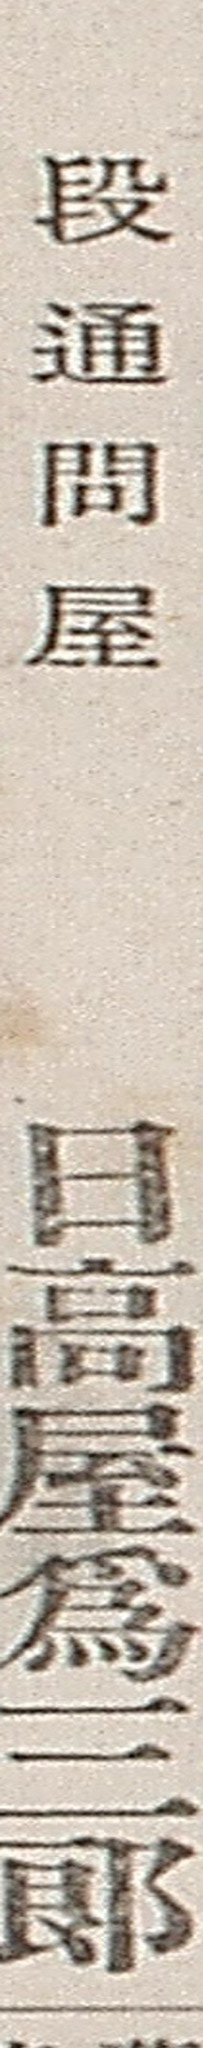段通問屋日高屋為三郎
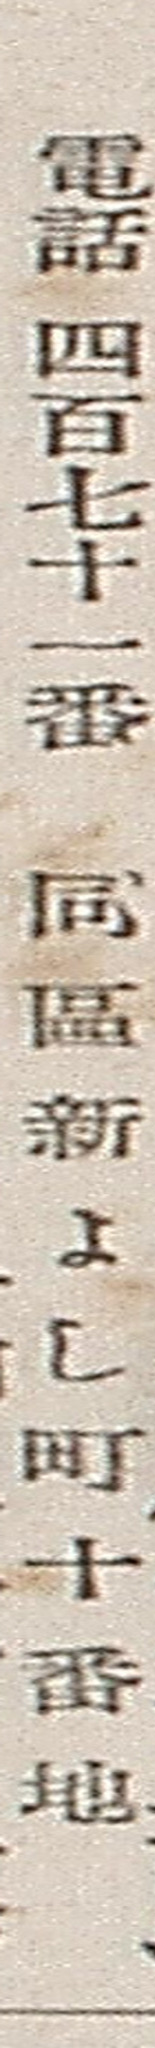電話四百七十一番同區新よし町十番地
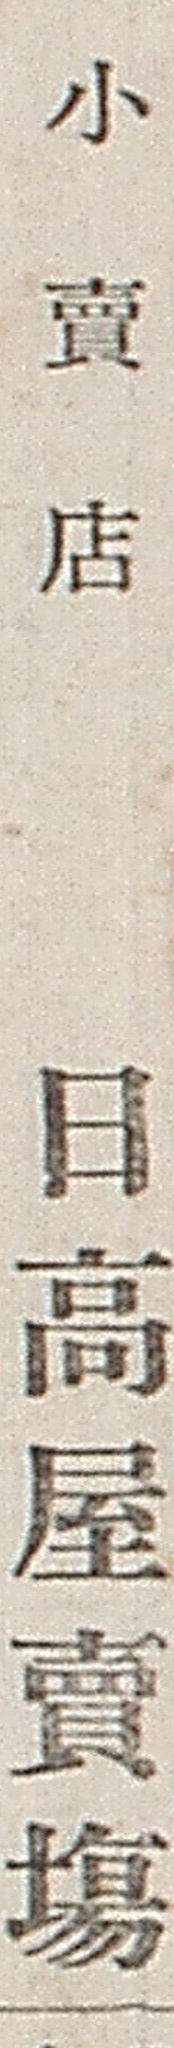小売店日高屋売場
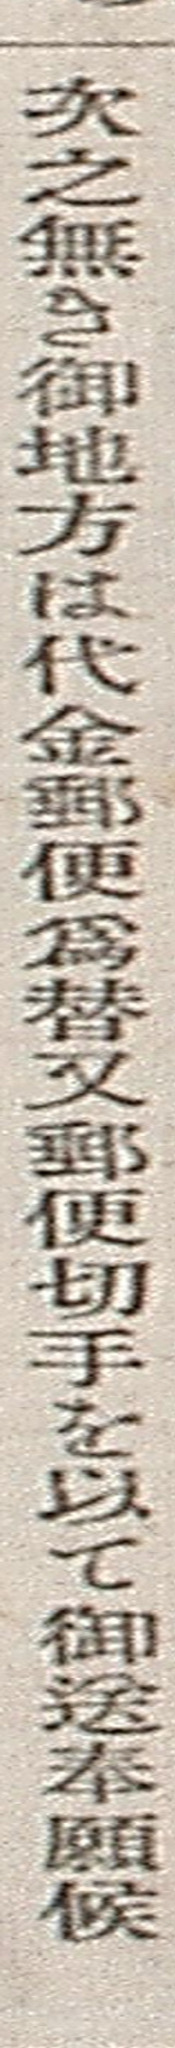次之無き御地方は代金郵便為替又郵便切手を以て御送奉願候
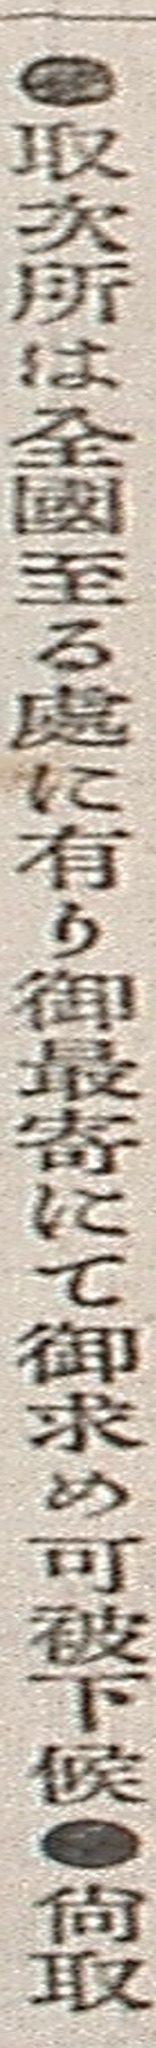●取次所は全国至る処に有り御最寄にて御求め可被下候

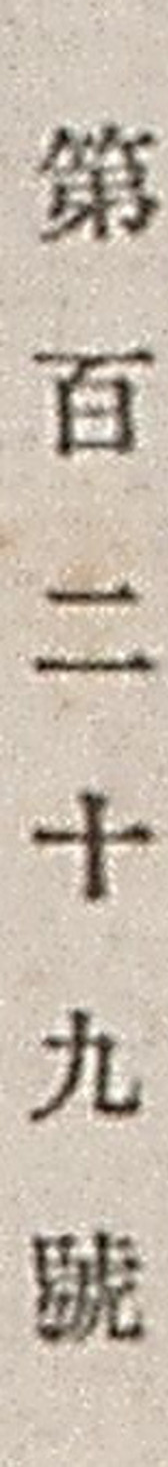第百九十七號
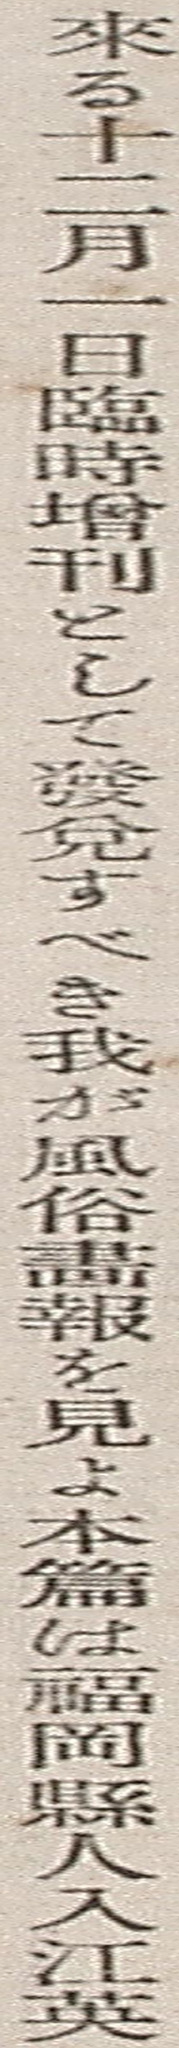来る十二月一日臨時増刊として發兌すべき我が風俗画報を見よ本篇は福岡縣人入江英
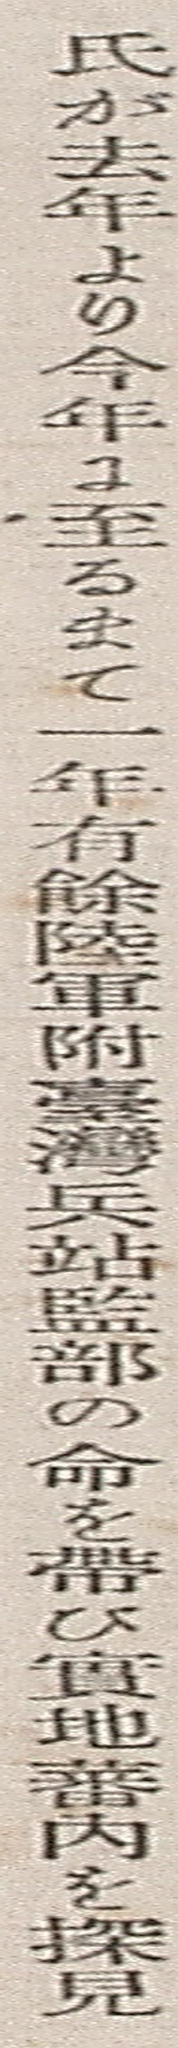氏が去年より今年に至るまて一年有餘陸軍附臺灣兵站監部の命を帯び実地蕃内を探見
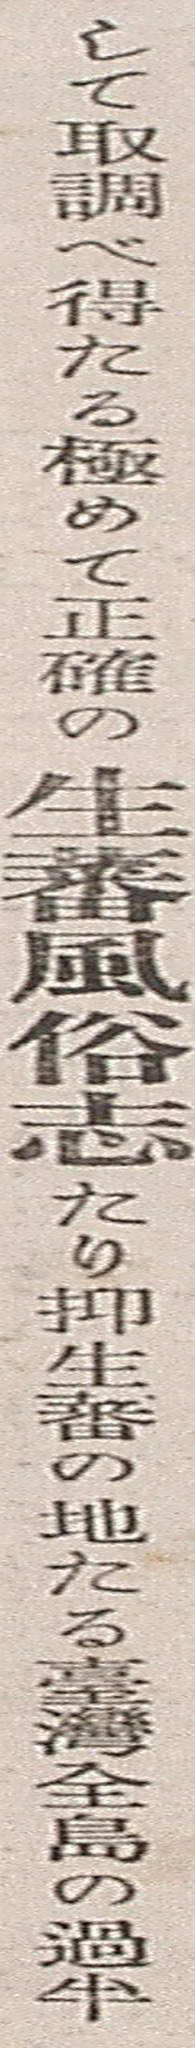して取調べ得たる極めて正確の生蕃風俗志たり抑生蕃の地たる臺灣全島の過半
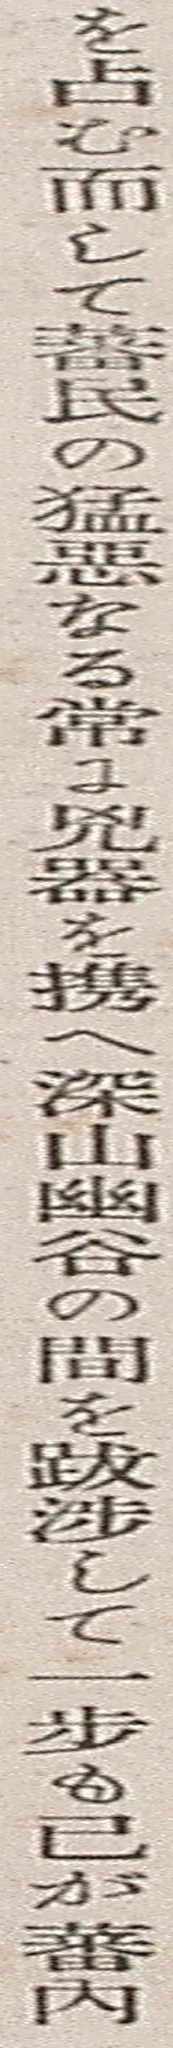を占む而して蕃民の猛悪なる常に兇器を携へ深山幽谷の間を跋渉して一歩も己が蕃内
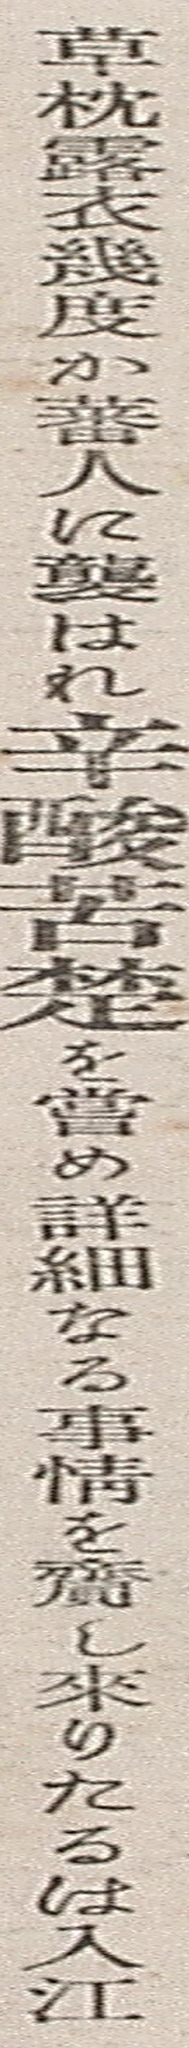草枕露衣幾度か蕃人に襲はれ辛酸苦楚を嘗め詳細なる事情を齎し来たりたるは入江
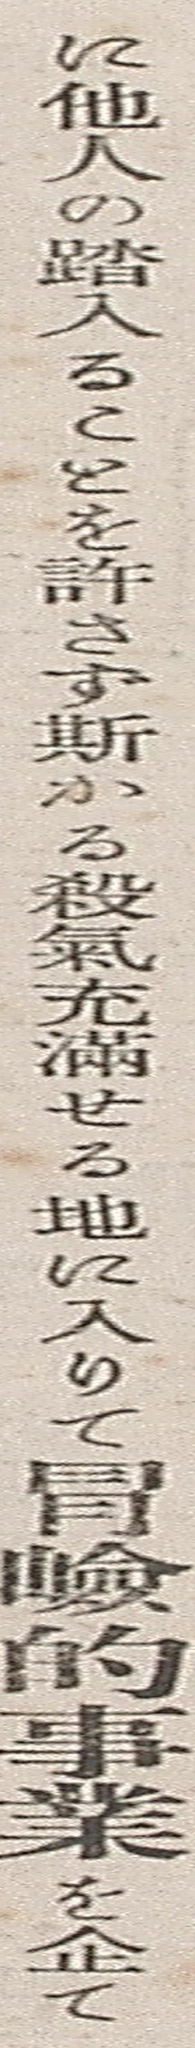に他人の踏入ることを許さず斯かる殺氣充満せる地に入りて冒嶮的事業を企て
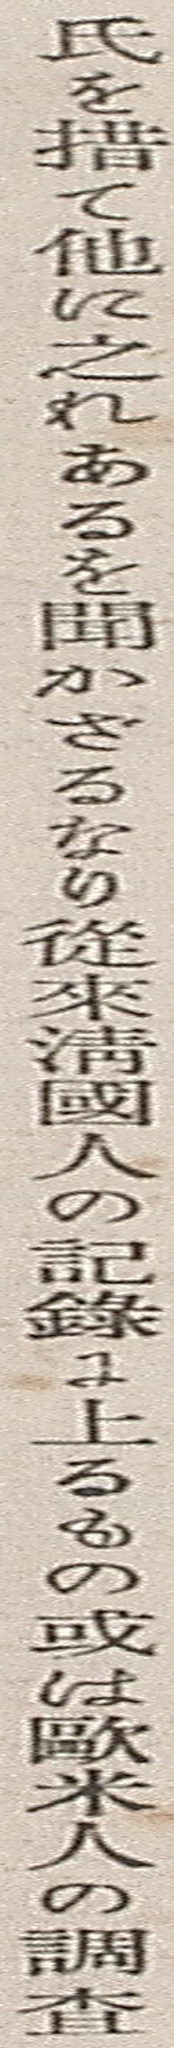氏を措て他に之れあるを聞かざるなり従来清國人の記録に上るもの或は欧米人の調査
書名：風俗畫報臨時増刊第百二十八號　洪水被害録（下）
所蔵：東京大学地震研究所図書室 Earthquake Research Institute Library, The University of Tokyo, JAPAN
